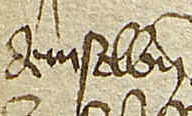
demſelbn*
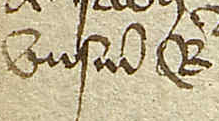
vnſm* B*
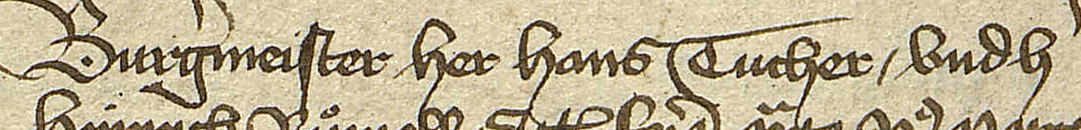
Burg*meiſter her hans Tucher / vnd h*
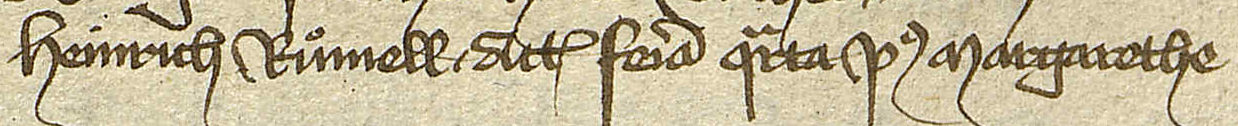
heinrich Rümell / Act* feia* qrta* p* Margarethe
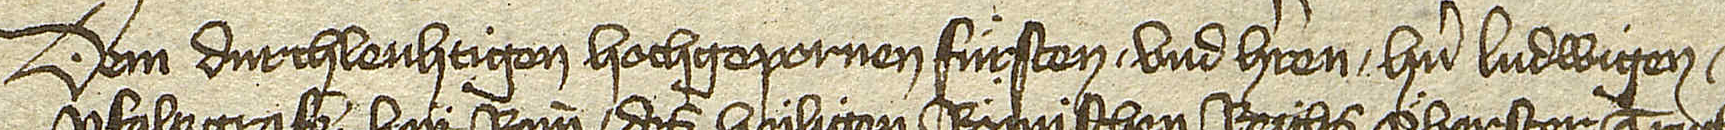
Dem durchleuhtigen hochgepornen fürſten / vnd h*ren / hn* ludwigen /
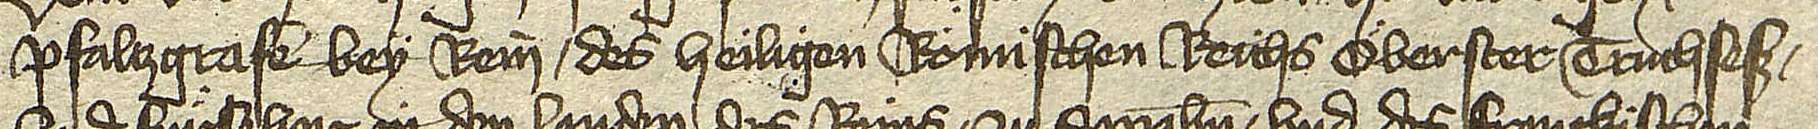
pfalcʒgrafe* bey Rein / des heiligen Römiſchen Reichs Öberſter Truchſeſʒ /
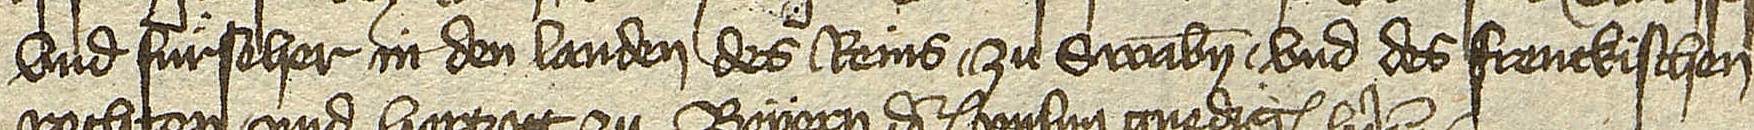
vnd fürſeher in den landen des Reins / cʒu Swabn* / vnd des frenckiſchen
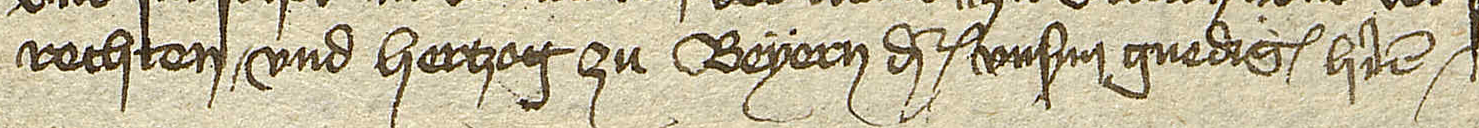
rechten / vnd hercʒog cʒu Beyern d* vnſ*m gnedig* h*re* /
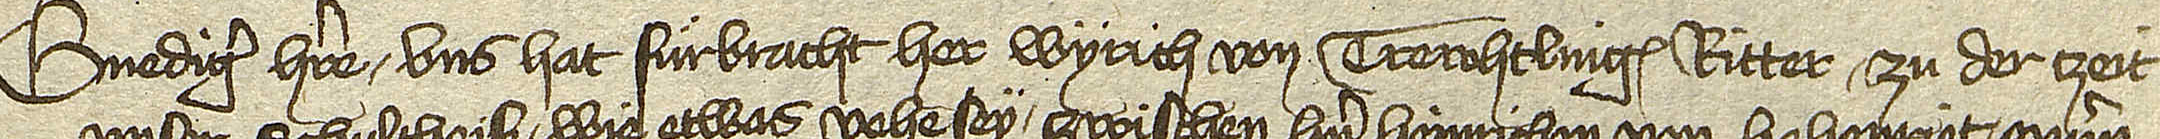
Gnedig* h*re / vns hat fürbracht her wyrich von Trewhtling* Ritter / cʒu der cʒeit
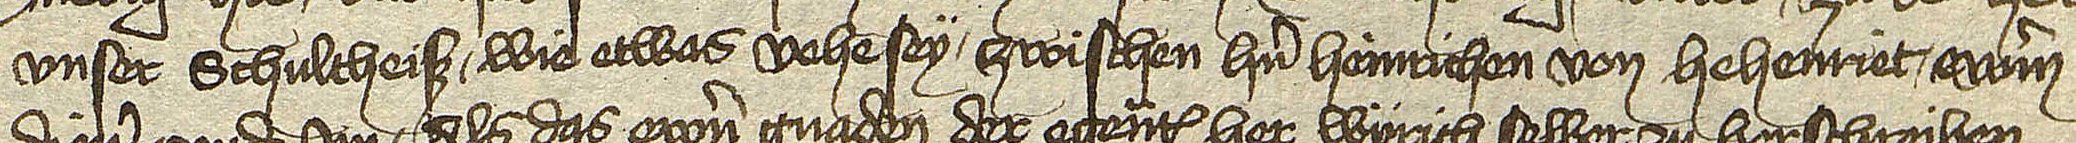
vnſer Schultheiſʒ / wie etwas vehe ſey cʒwiſchen hn* heinrichen von hehenriet / ewm*
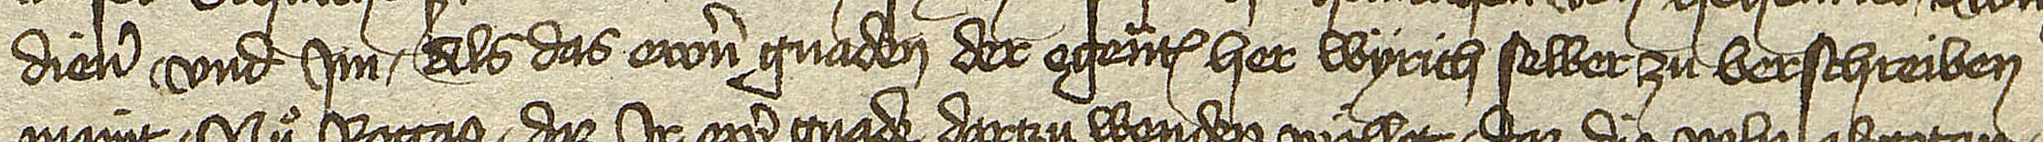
dien* / vnd Im / Als das ewn* gnaden der egen*t* her wyrich ſelber cʒu verſchreiben
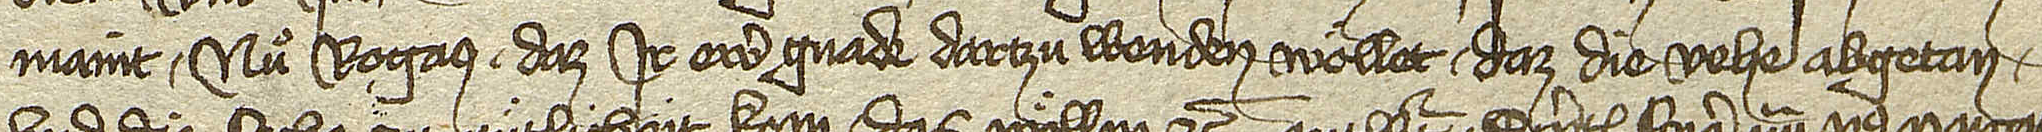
maint / Nü Roga* / daʒ Ir ew* gnade darcʒu wenden wöllet / daʒ die vehe abgetan /
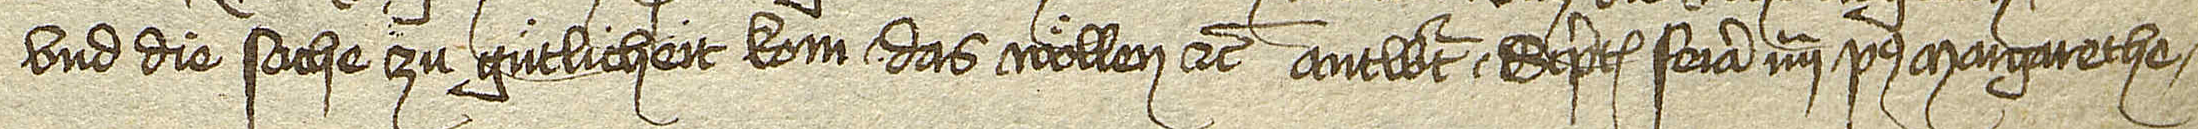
vnd die ſache cʒu gütlicheit kom / das wöllen ec* antwt* / Scpt* feia* iiii* p* Margarethe /
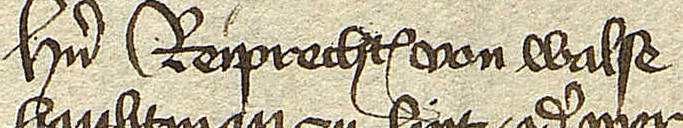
hn* Reiprecht* von walſe
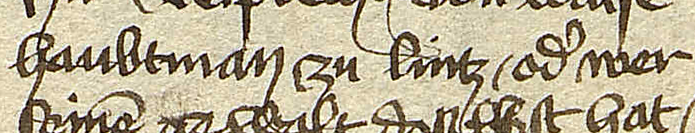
haubtman cʒu lintʒ / od* wer
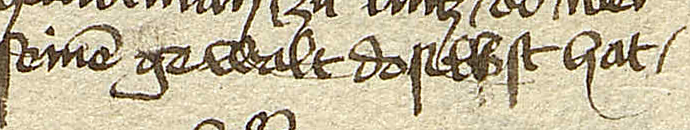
ſeine* gewalt doſelbſt hat /
